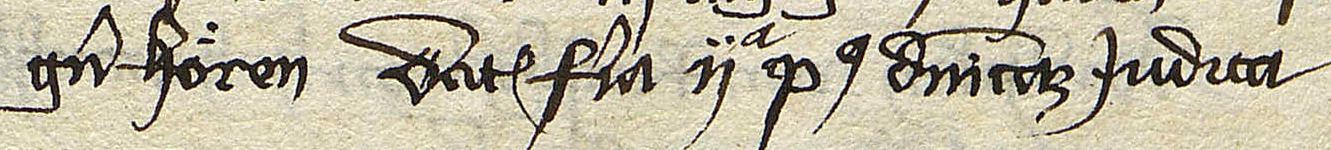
g*n hören Dat* f*ia ii* p* dnica* Iudica
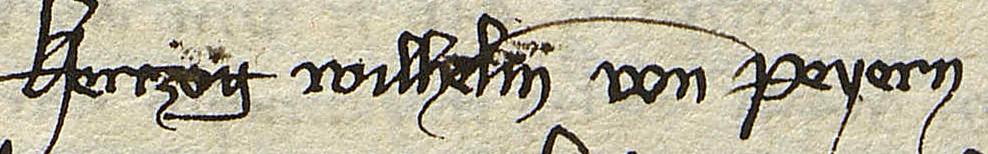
Hercʒog wilhelm* von Peyern
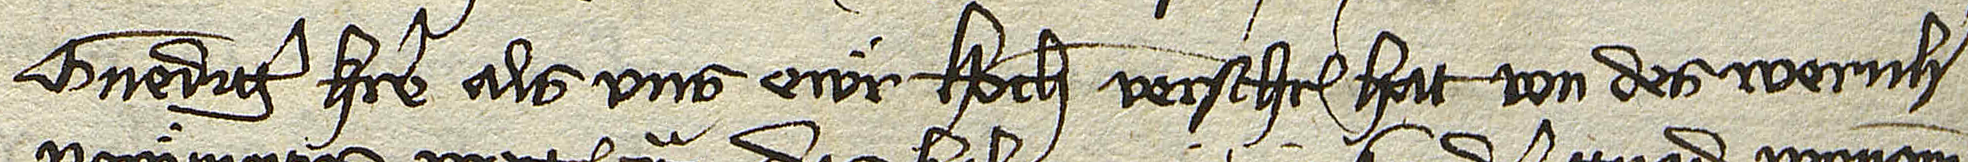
Gnedig* h*re als vns eẅr Hoch* verſchr* hat von des wernh*
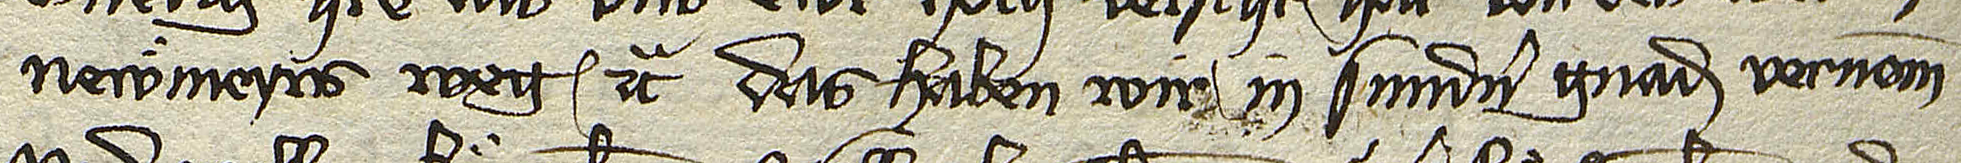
neẅmeyrs weg* ec* Das haben wir in ſund*n gnad* vernom*
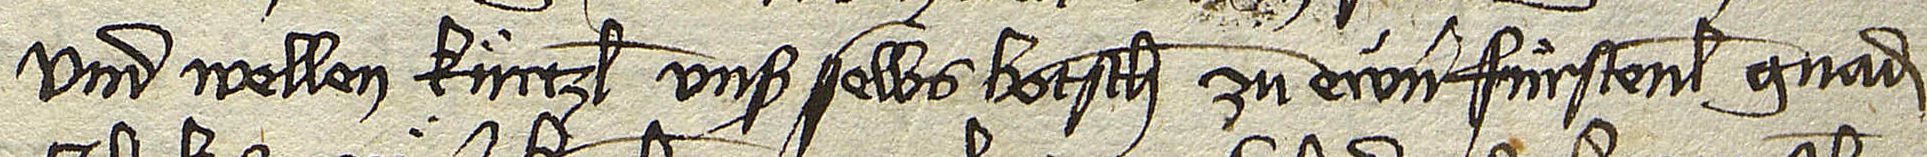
vnd wellen kürcʒl* vnſ* ſelbs botſch* ʒu eẅ*n fürſtenl* gnad*
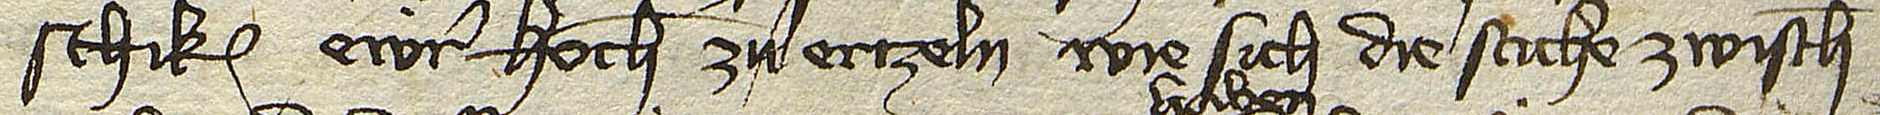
ſchik* eẅr hoch* ʒu ercʒeln wie ſich die ſache ʒwiſch*
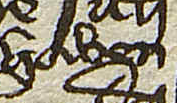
haben
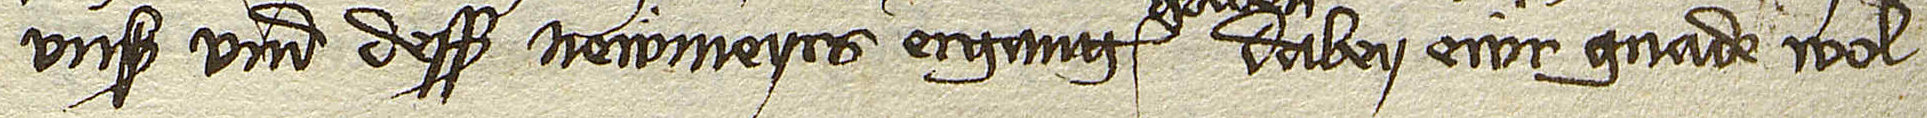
vnſ* vnd deſſ* neẅmeyrs ergang* dabey eẅr gnade wol
